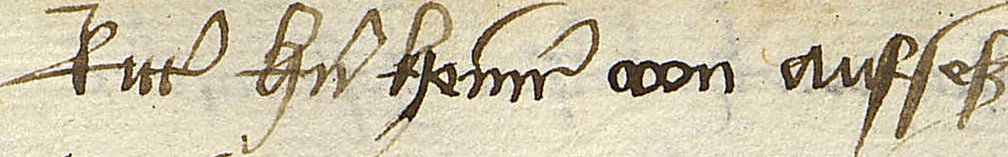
Ritt* H*n heinr* von aufſeſʒ
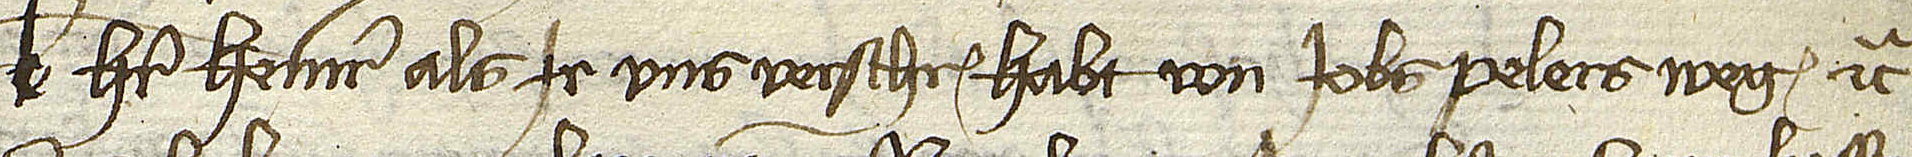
L* h*r heinr* als Ir vns verſchr* habt von Iobs pelers weg* ec*
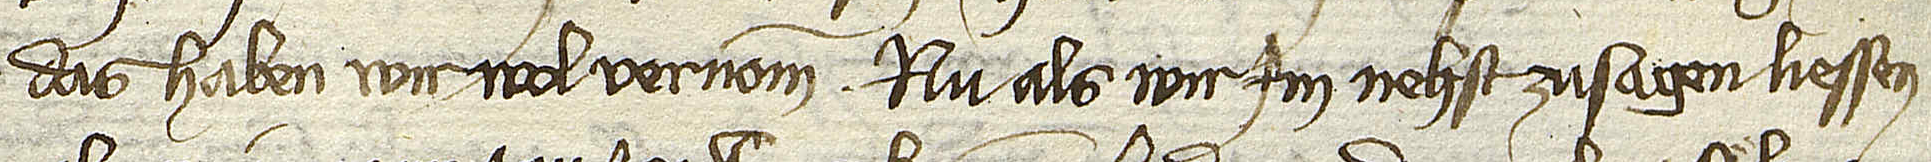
das haben wir wol vernom* . Nu als wir Im nehſt ʒuſagen lieſſen
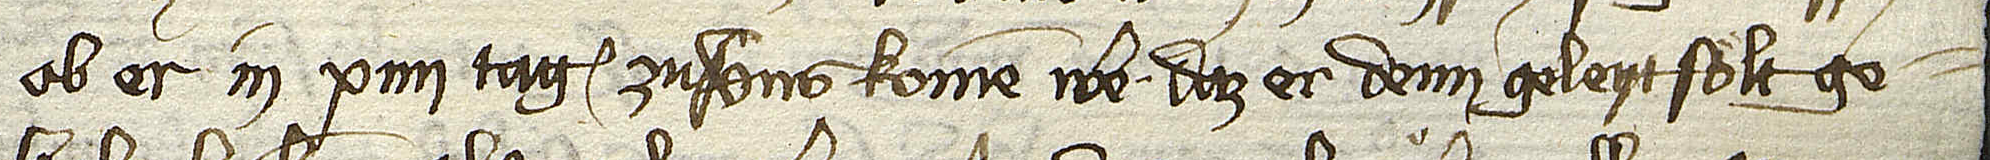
ob er in xiiii tag* ʒu Vns kome* w*e . daʒ er denn geleyt ſölt ge =
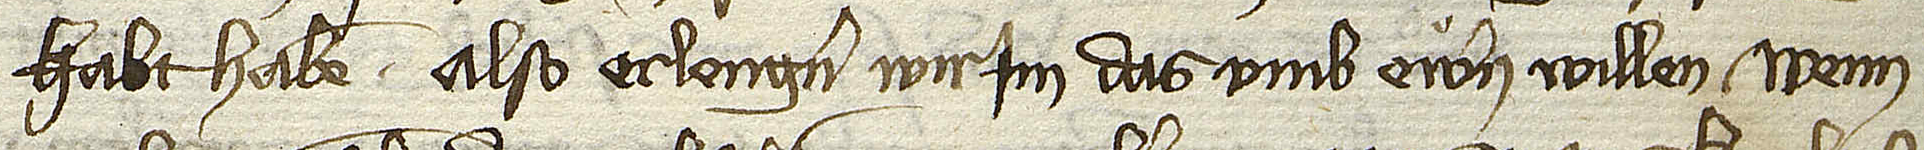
habt habe* . Alſo erleng*n wir Im das vmb ew*n willen / wenn
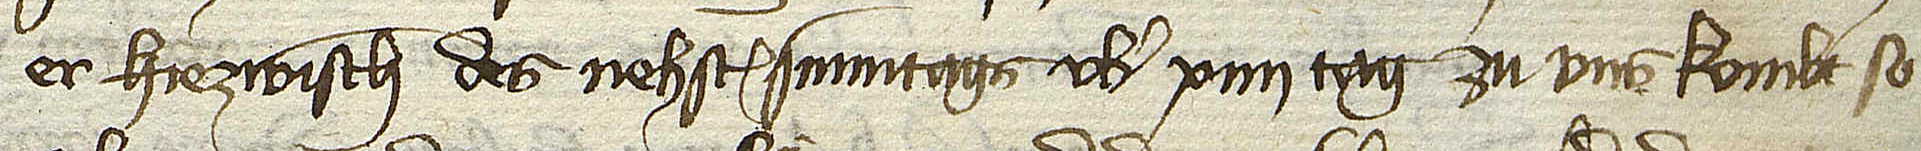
er hieʒwiſch* des nehſt* ſunntags vb* xiiii tag ʒu vns kombt ſo
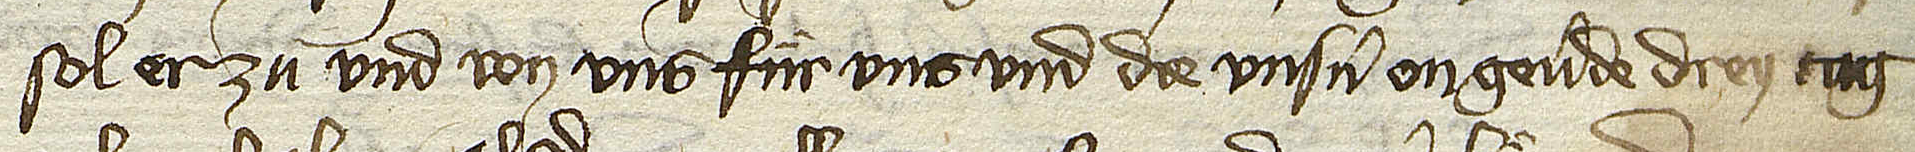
ſol er ʒu vnd von vns für vns vnd die vnſ*n on geu*de drey tag
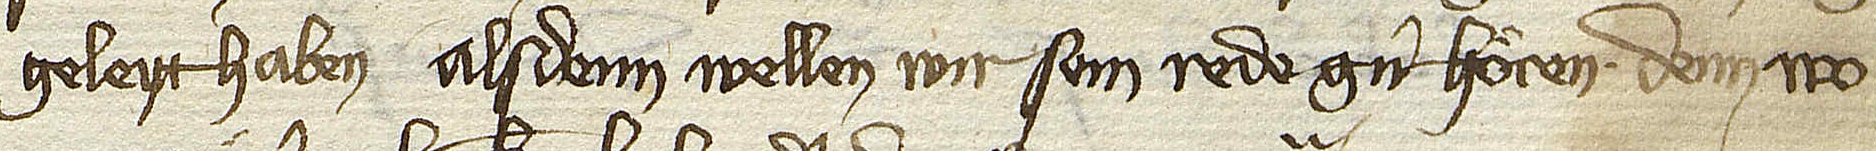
geleyt haben Alſdenn wellen wir ſein rede g*n hören . Denn wo
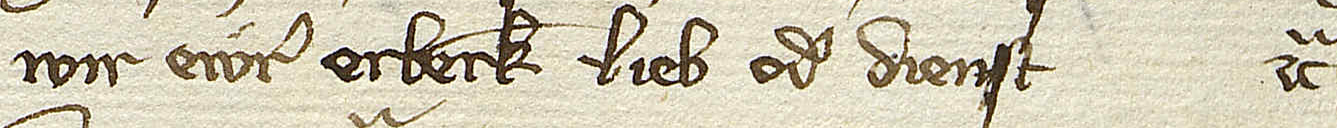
wir ew*r erberk* lieb od* dienſt ec*
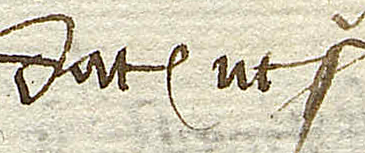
Dat* ut ſ*
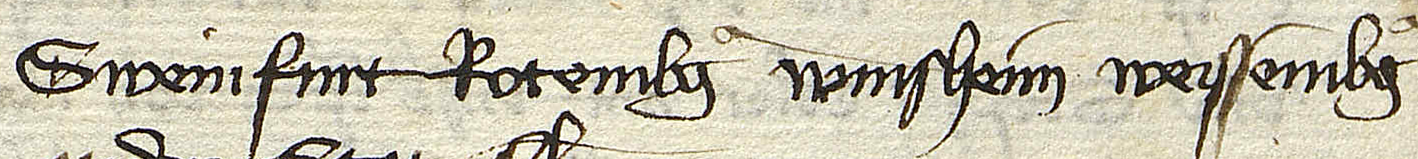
Sweinfurt Rotemb*g winſheim weiſſemb*g
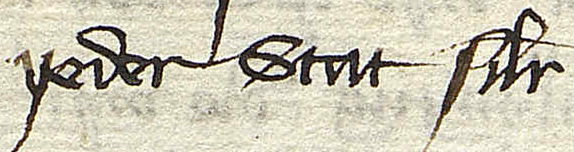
yeder Stat ſilr*
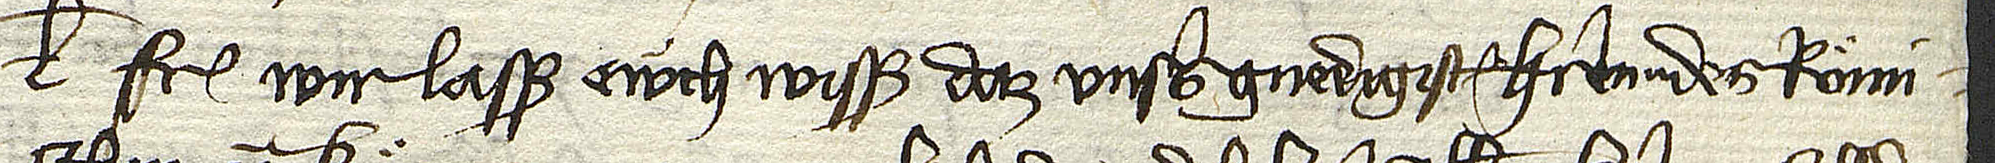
L* fr* wir laſſ* ewch wiſſ* daʒ vnſ*s gnedigiſt* h*ren ~ des Römi =
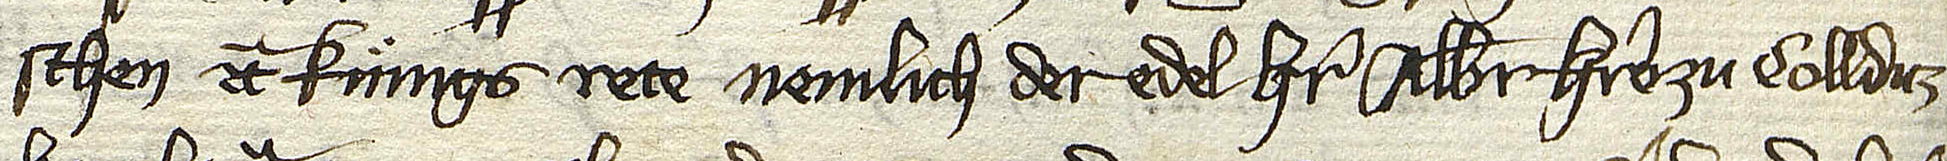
ſchen ec* künigs rete nemlich der edel h*r Albr* h*re ʒu Colldicʒ
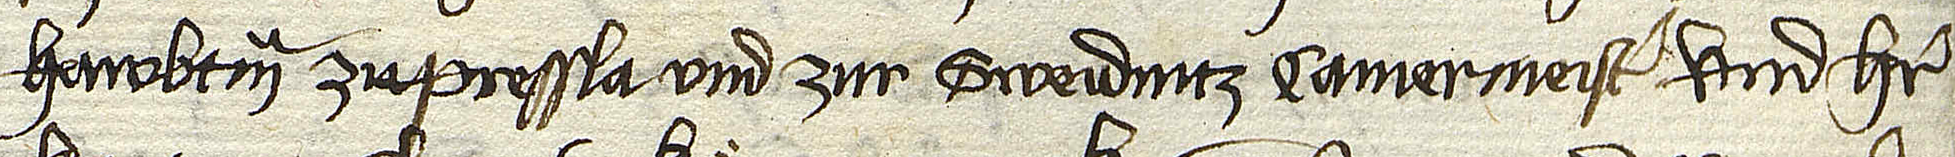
hawbtm* ʒu Preſſla vnd ʒur Sweidnicʒ Camermeiſt* Vnd h*r
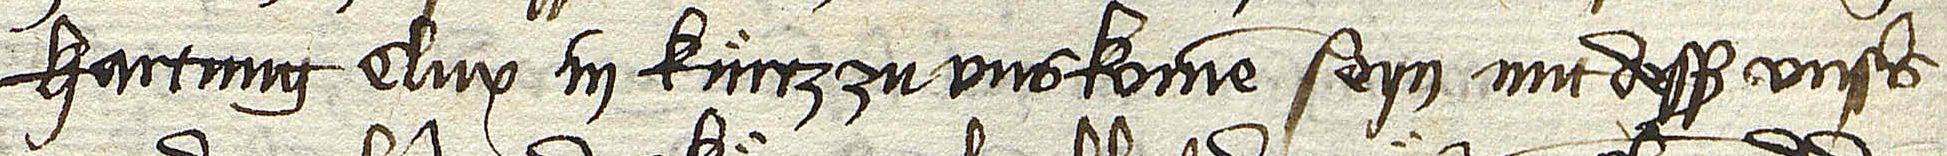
Hartung Clux in kürcʒ ʒu vns kome* ſeyn mit deſſ* vnſ*s
